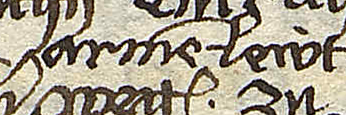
arme* leẅt
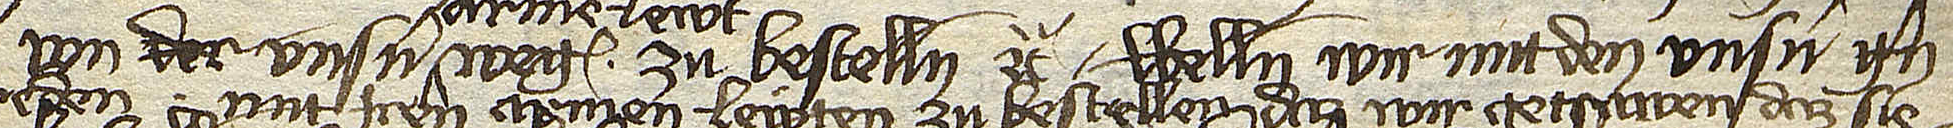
von der vnſn* weg* . ʒu beſtelln* ec* / welln* wir mit den vnſn* g*n
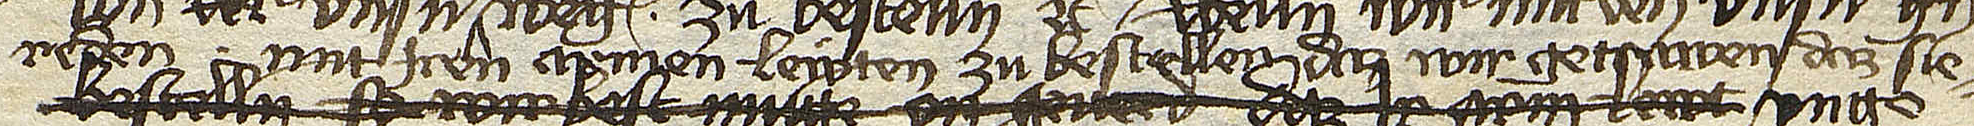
reden . mit Iren armen leẅten ʒu beſtellen daʒ wir getrawen daʒ ſie
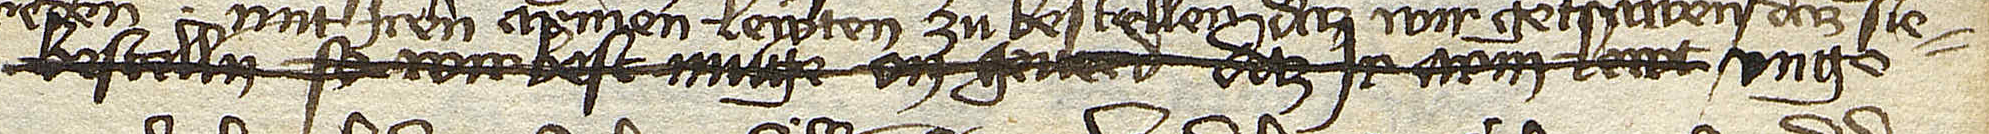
beſtelln* ſo wir beſt muge* on geuerd daʒ Ir arm leẅt vnge =
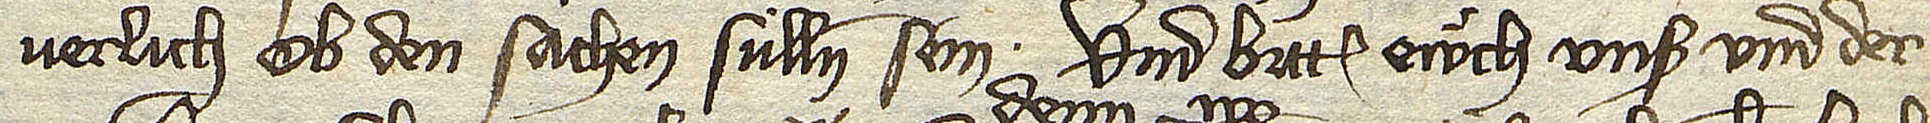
uerlich Ob den ſachen ſülln ſein . Vnd bitt* eẅch vnſ* vnd der
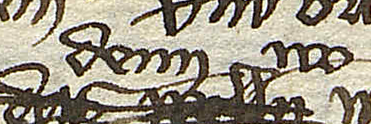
denn wo
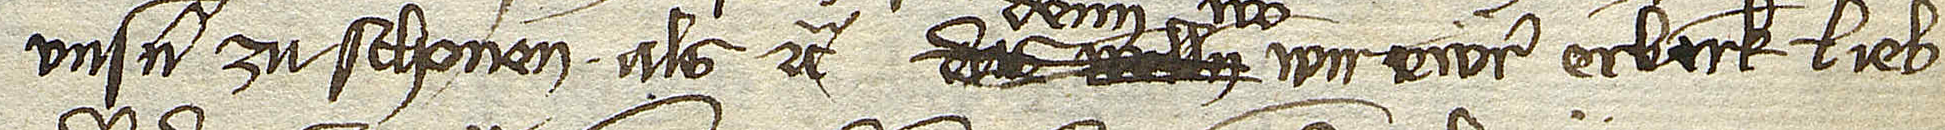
vnſn* ʒu ſchonen / als ec* Das welln* wir eẅr* erberk* lieb
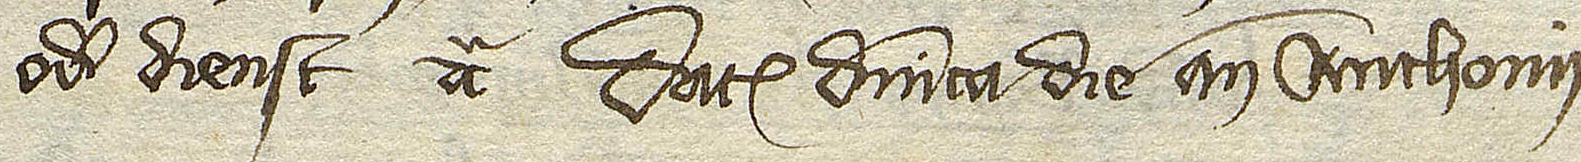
od* dienſt ec* Dat* dni*ca die an* Anthonii
